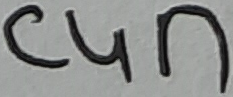сип
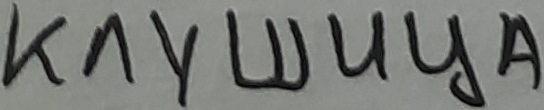клушица
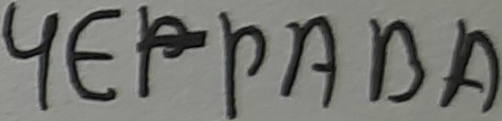чеграва
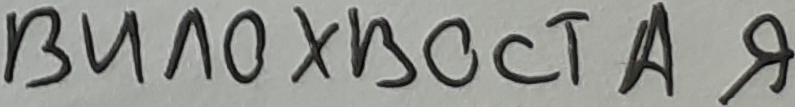вилохвостая
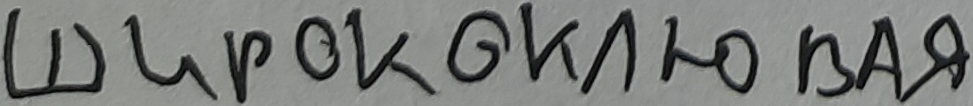ширококлювая
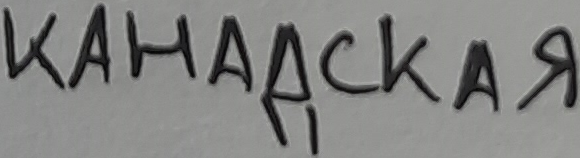канадская
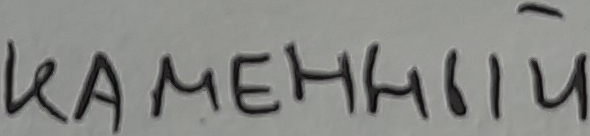каменный
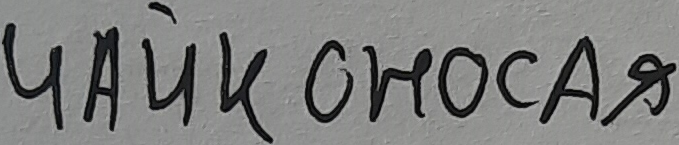чайконосая
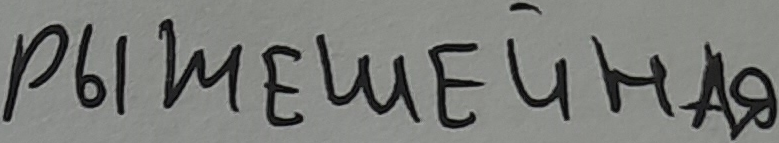рыжешейная
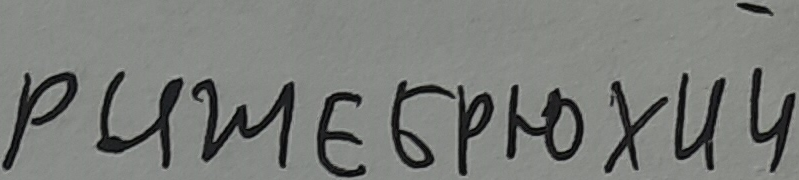рыжебрюхий
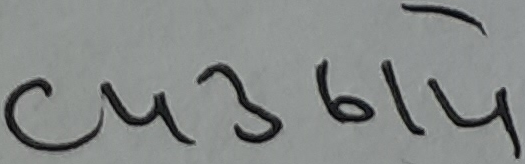сизый
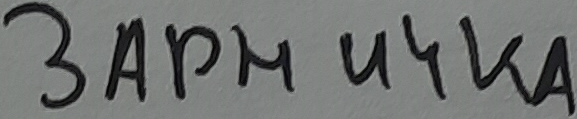зарничка
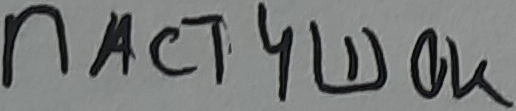пастушок
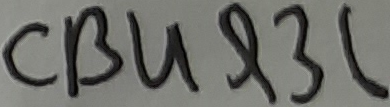свиязь
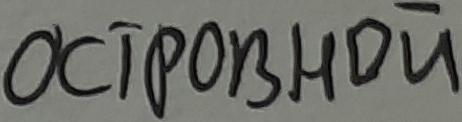островной
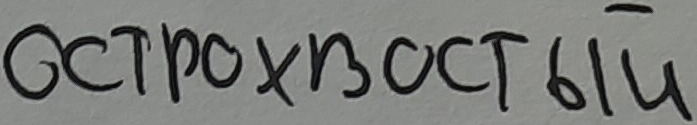острохвостый
